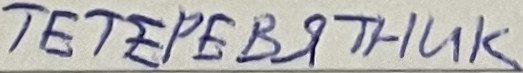тетеревятник
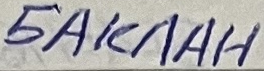баклан
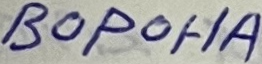ворона
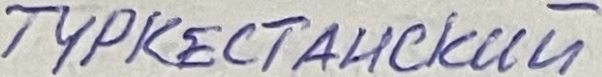туркестанский
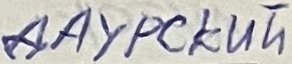даурский
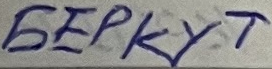беркут
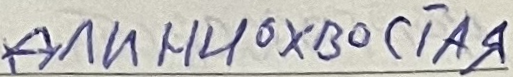длиннохвостая
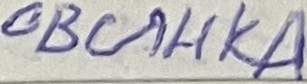овсянка
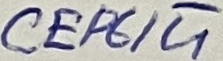серый
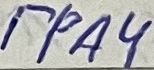грач
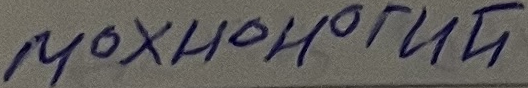мохноногий
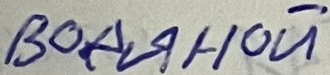водяной
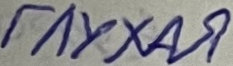глухая
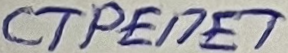стрепет
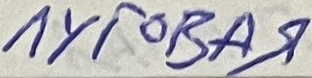луговая
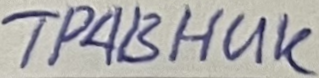травник
